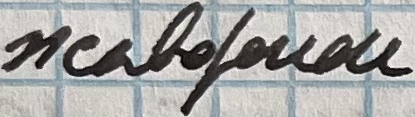жаворонок
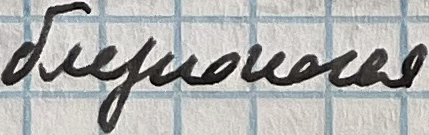бледноногая
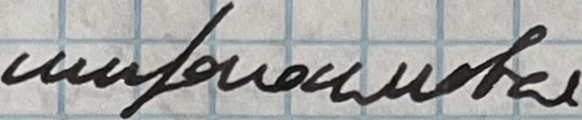ширококлювая
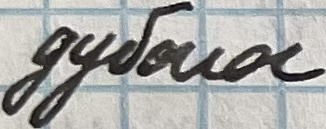дубонос
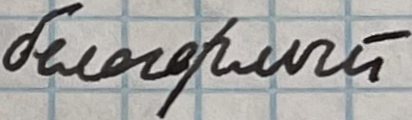белогорлый
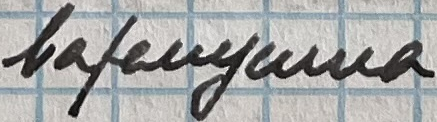варакушка
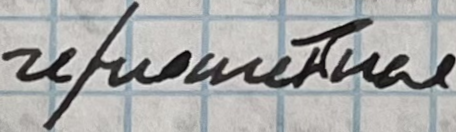черношейная
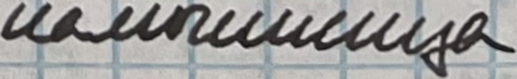камышница
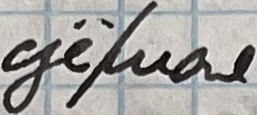озёрная
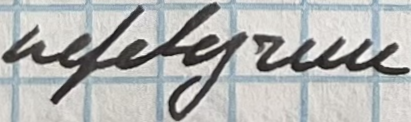перевозчик
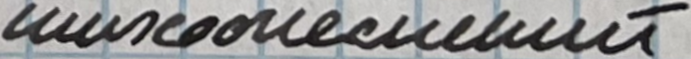тихоокеанский
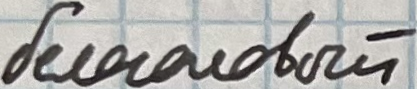белоголовый
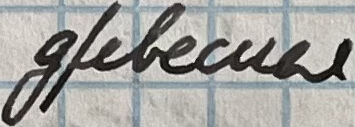древесная
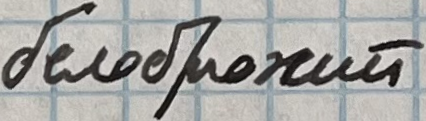белобрюхий
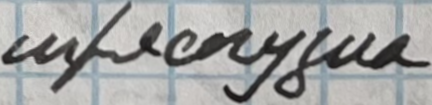трясогузка
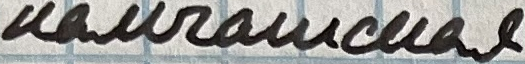камчатская
